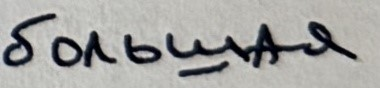большая
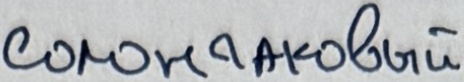солончаковый
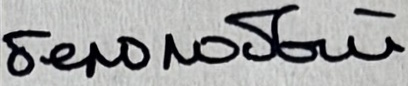белолобый
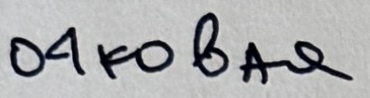очковая
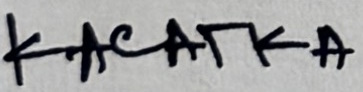касатка
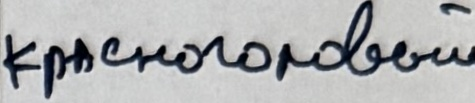красноголовый
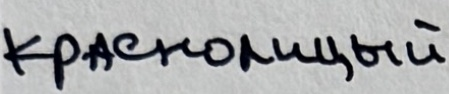краснолицый
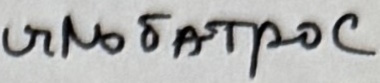альбатрос
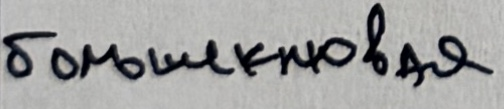большеклювая
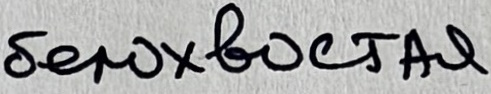белохвостая
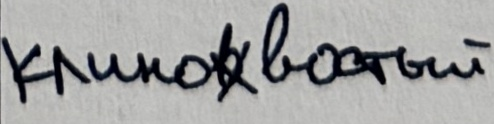клинохвостый
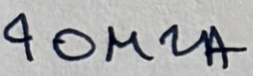чомга
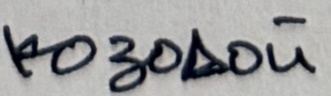козодой
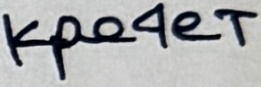крочет
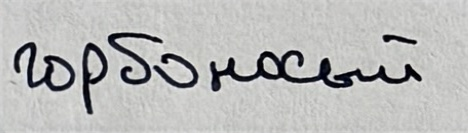горбоносый
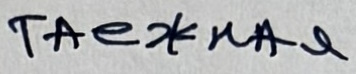таежная
